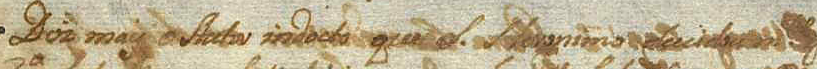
Diz mais o Autor indocto que S. Heronimo duvidou m.to
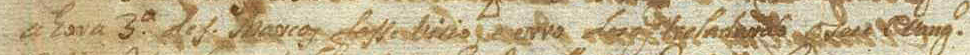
a hora 3.a de S. Marcos fosse vicio e erro dos q̄ tresladarão o seu euang.o
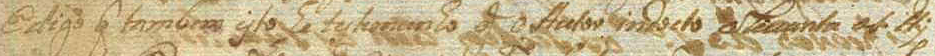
E digo q̄ tambem isto he testemunho q̄ o Autor indocto aLeuanta a s. Hy
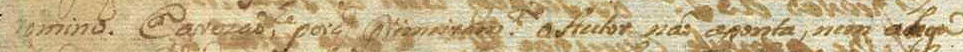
romino. E a rezaõ, he porq̄ primeiram.te: o Autor naõ aponta, nem alega
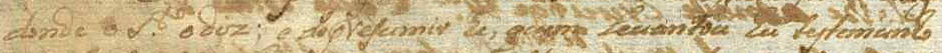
donde o s.to o diz; e do presumir he, quem Leuantou hū testemunho
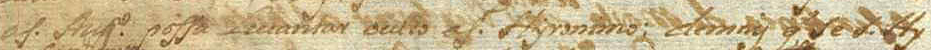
a s. Aug.o possa Leuantar outro a s. Hyronimo; demais q̄ se s. Hy
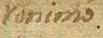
ronimo
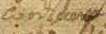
conhecesse
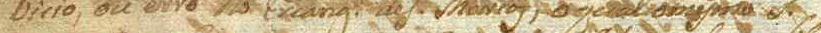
Vicio, ou erro no Euang.o de s. Marcos, o qual o mesmo s.
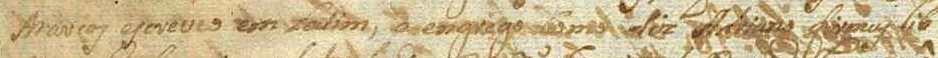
Marcos escreveo em Latim, e en grego como diz Adriano firmus lib
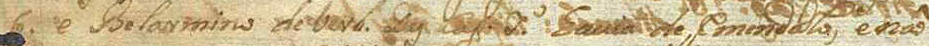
6. e Belarmino de berb. Des Cap. 7.o hauia de Comendalo, e naõ
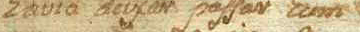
havia deixar passar hum
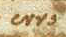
erro
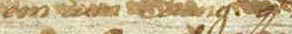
em hum Euang.o q̄
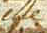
elle
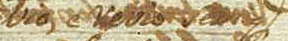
vio, e revio sem q̄
